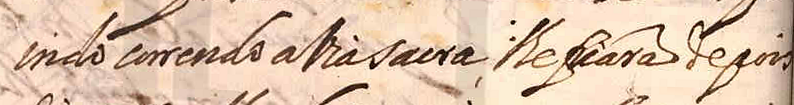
indo correndo a Via sacra lhe ficaraõ depois
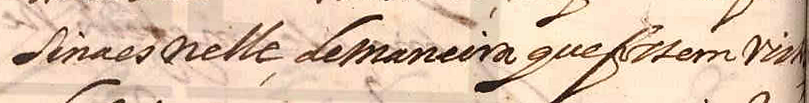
sinaes nelle, de maneira que fossem vist
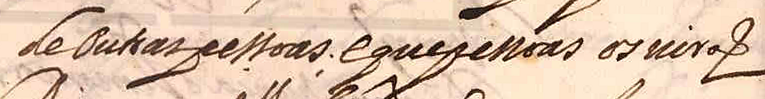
de outras pessoas, e que pessoas os uiraõ?
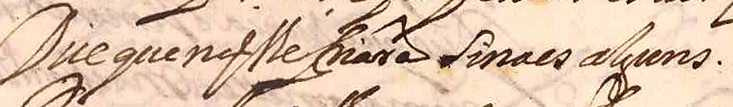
Dice que naõ lhe ficarā sinaes alguns.
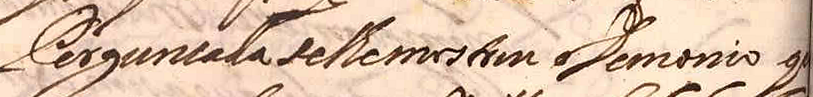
Perguntada se lhe mostrou o Demonio qu
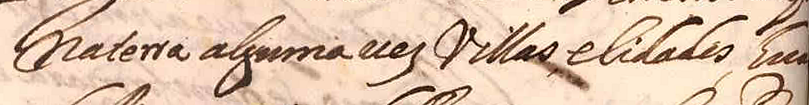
na terra alguma uez Villas, e Cidades hua
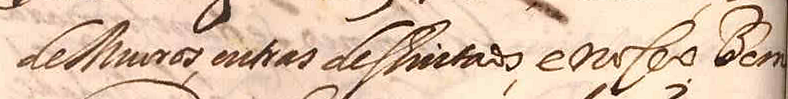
de Mouros, outras de Christaos, e no Ceo Bem
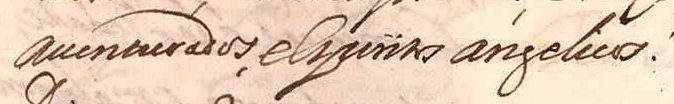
auenturados, e Espiritos angelicos?
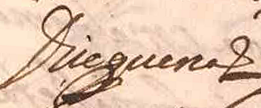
Dice que naõ
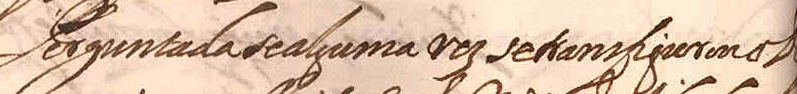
Perguntada se alguma vez se transfigurou o D
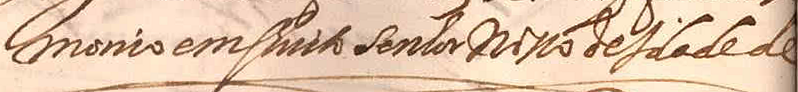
monio em Christo senhor nosso de Jdade de
